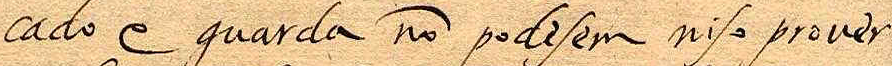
cado e guarda nō podesem niso prouer
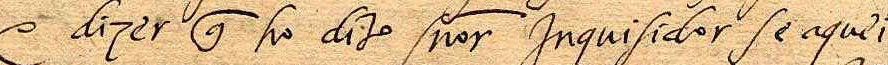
e dizer q̄ ho dito snōr Jnquisidor se aquei
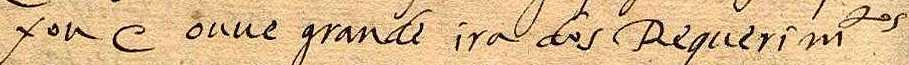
xou e ouue grande ira dos Requerimtos
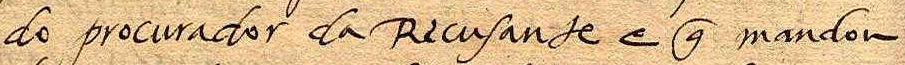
do procurador da Recusante e q̄ mandou
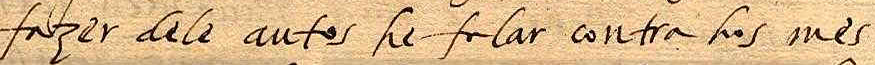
fazer dele autos he falar contra hos mes
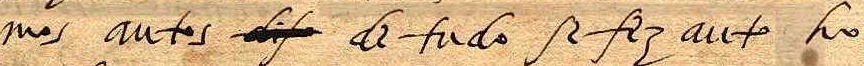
mos autos dis de tudo se fez auto ho
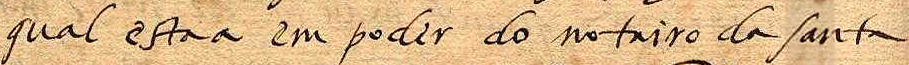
qual estaa em poder do notairo da santa
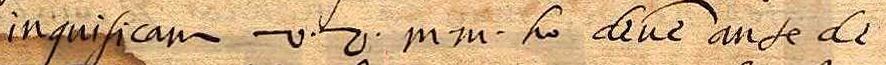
inquisiçam v.v. m.m. ho deuē ante de
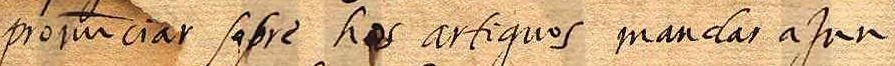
pronūciar sobre hos artiguos mandar aJun
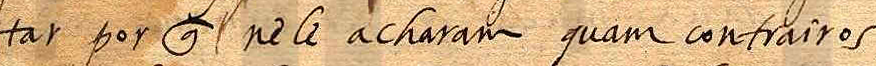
tar porq̄ nele acharam quam contrairos
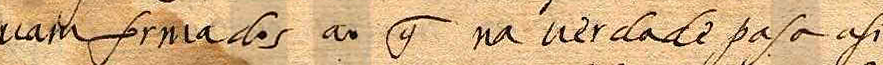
uam formados ao q̄ na uerdade pasa asi
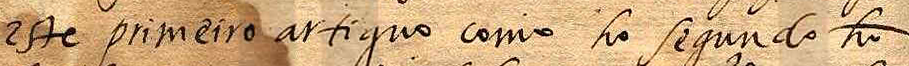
este primeiro artiguo como ho segundo hō
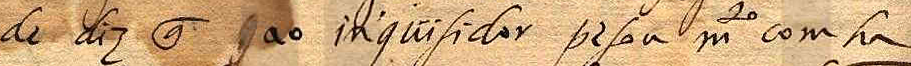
de diz q̄ ao inquisidor pesou mto com ha
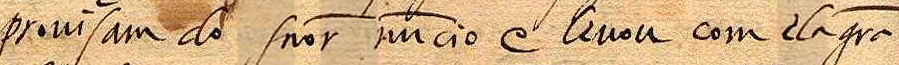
prouisam do snōr nūcio e leuou com ela grā
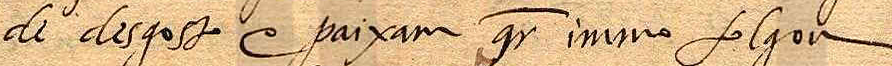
de desgosto e paixam q̄r immo folgou
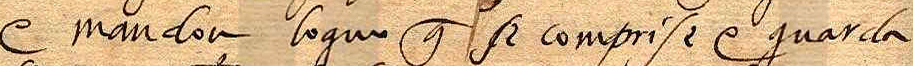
e mandou loguo q̄ se comprise e guarda
